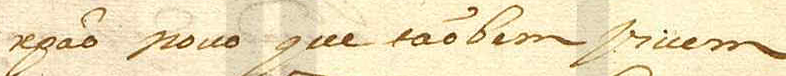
xpaõ nouo que taõbem Vivem
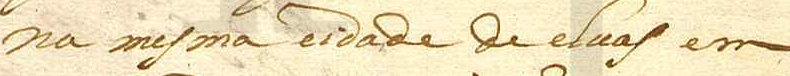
na mesma cidade de eluas em
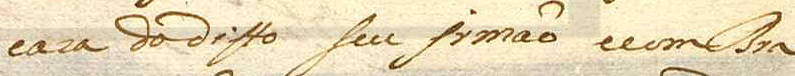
caza do ditto seu jrmaõ e com Bra
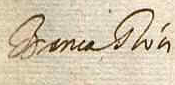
Branca Roiz̄
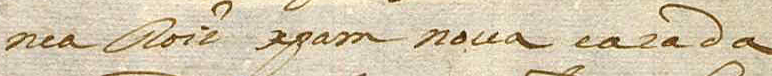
nca Roiz̄ xpam noua cazada
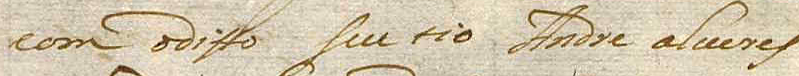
com o ditto seu tio Andre alueres
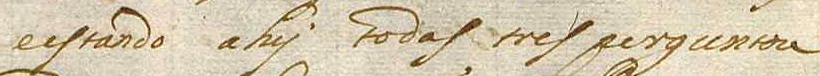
e estando ahy todas tres perguntou
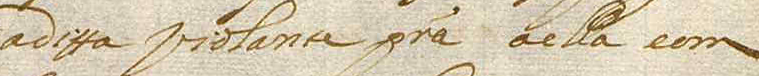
a ditta Violante pr̄a a ella com
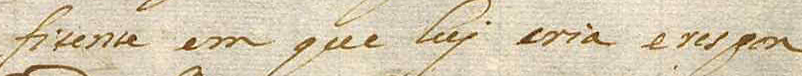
fitente em que ley cria e respon
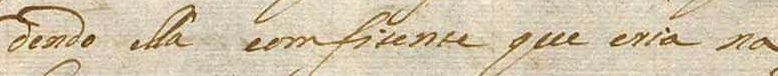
dendo ella comfitente que cria na
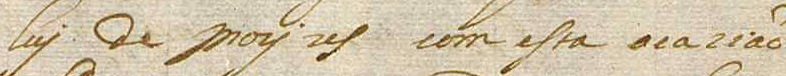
ley de moyzes com esta ocaziaõ
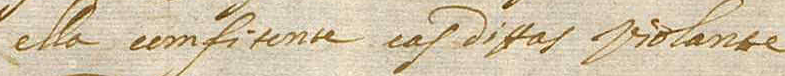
ella comfitente e as dittas Violante
